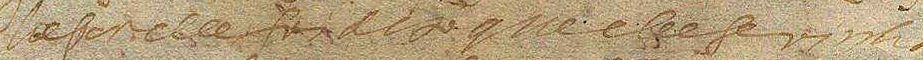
he por elle foi dito que elle se vinha
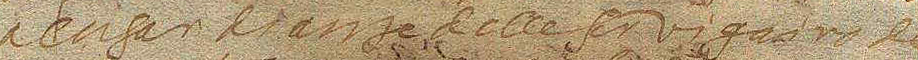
acusar diante delle sor̄ vigairo de
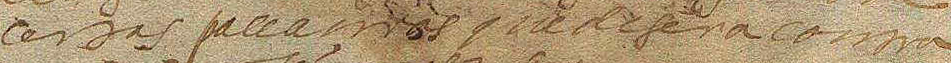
certas pallauras que disera contra
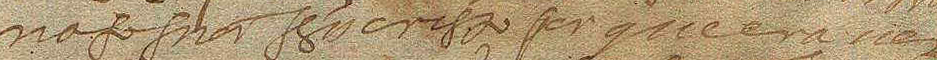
noso snor̄ Jhū cristo porque era uer
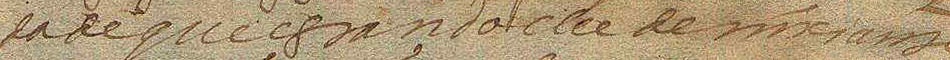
dade que estando elle denūciante
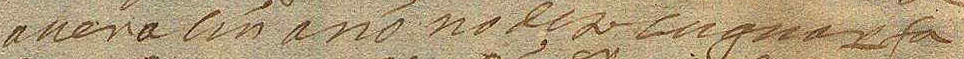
auera hū anō no dito luguar fa
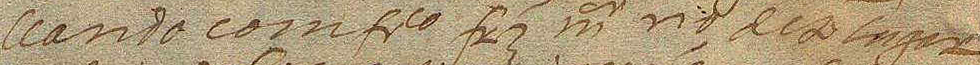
llando com frco frz̄ mor no dito lugar
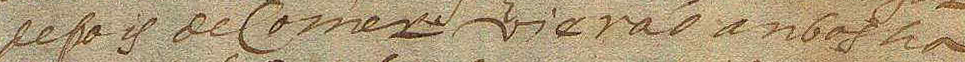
depois de Comer vieraõ anbos ha
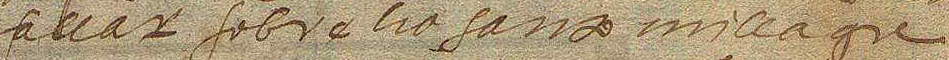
fallar sobre ho santo millagre
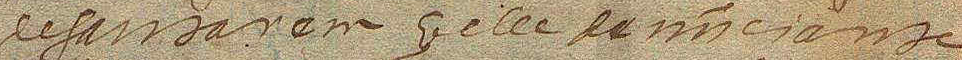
de santarem & elle denūciante
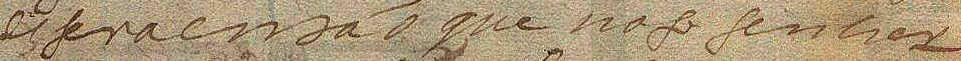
disera entaõ que noso senhor
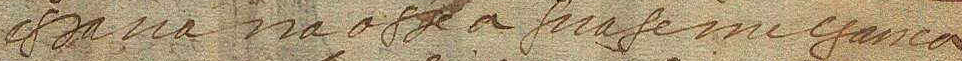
estaua na ostea sua semelhanca
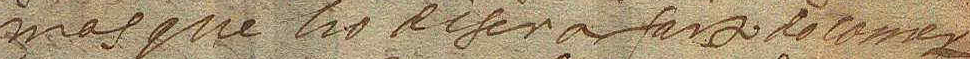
mas que ho disera farto do comer
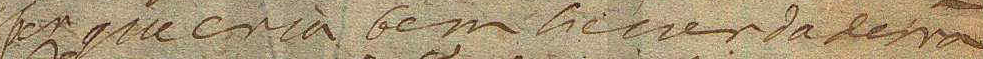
porque cria bem he uerdadeira
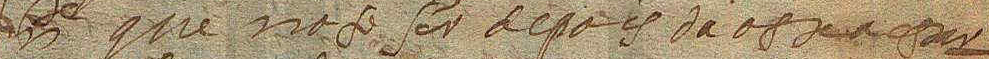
mte que noso sor̄ depois da ostea estar
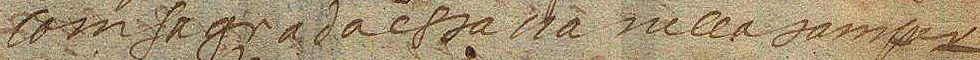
comsagrada estaua nella tam per
